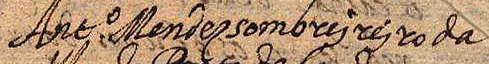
Anto Mendez sombrejrejro da
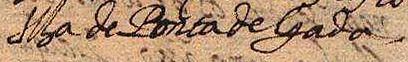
Ilha de Ponta delgada
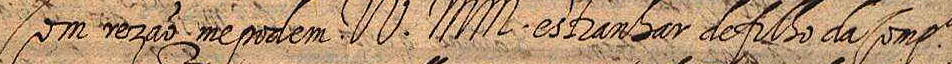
Com rezaõ me podem VV. MM. estranhar de filho da Comp.a
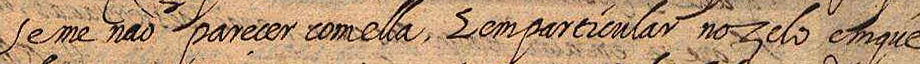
se me naõ pareçer com ella, E em particular no zelo em que
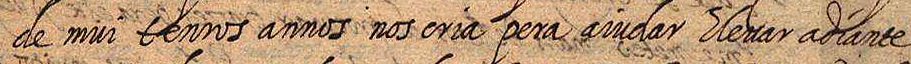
de mui tenros annos nos cria pera aiudar E leuar adiante
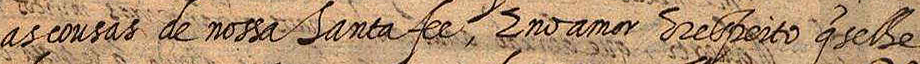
as cousas de nossa Santa fee, E no amor E respeito q̄ se lhe
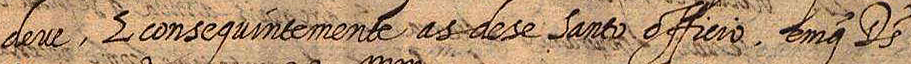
deue, E conseguintemente as dese santo officio em q̄ Ds̄
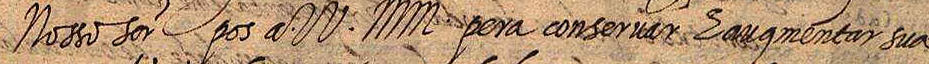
Nosso sor̄ pos a VV. MM. pera conseruar E augmentar sua
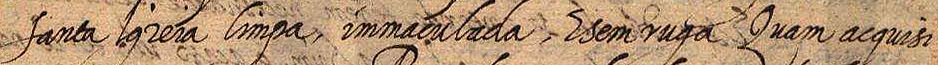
Santa Igreia limpa, immaculada, E sem ruga Quam acquisi
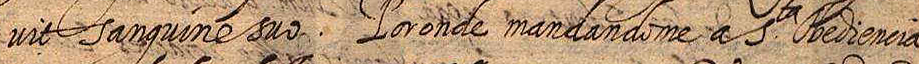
uit sanguine suo. Por onde mandandome a S.ta Obediencia
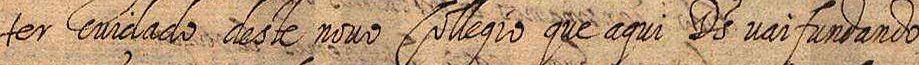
ter cuidado deste nouo Collegio que aqui Ds̄ uai fundando,
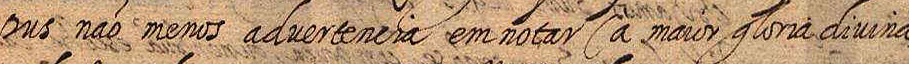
pus naõ menos aduertencia em notar (a maior gloria diuina)
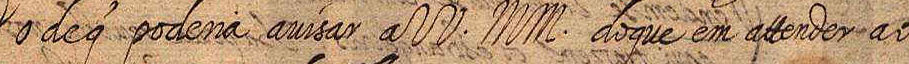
o de q̄ poderia auisar a VV. MM. do que em attender ao
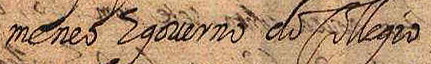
meneo E gouerno do Collegio,
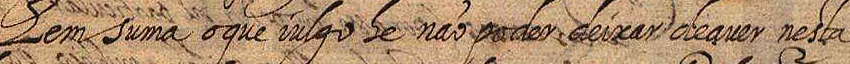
E em suma o que iulgo he naõ poder deixar de auer nesta
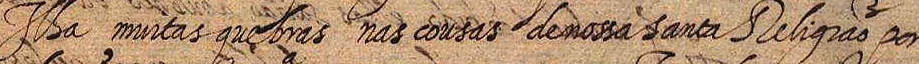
Jlha muitas quebras nas cousas de nossa santa Religiaõ por
